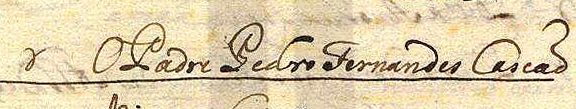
item O Padre Pedro Fernandes Cascaõ
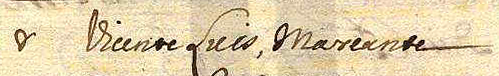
item Vicente Luis, mareante
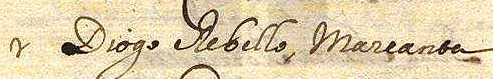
item Diogo Rebello, mareante
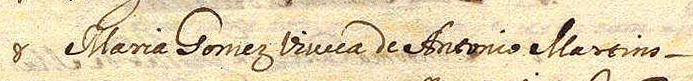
item Maria Gomez viuua de Antonio Martins
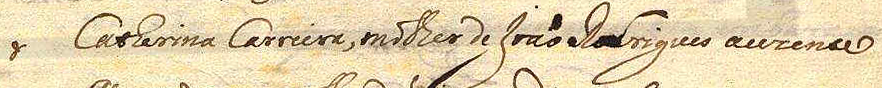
item Catherina Carreira, molher de Joaõ Rodrigues auzente
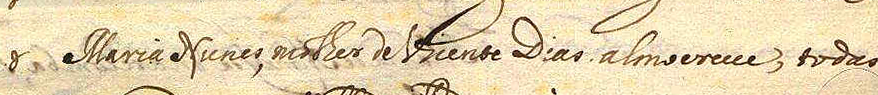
item Maria Nunes, molher de Vicente Dias almocreue, todas
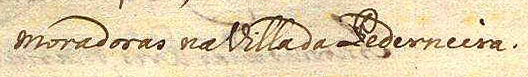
moradoras na Villa da Pederneira.
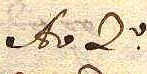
Ao 2o.
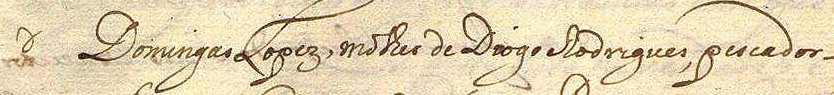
item Domingas Lopez, molher de Diogo Rodrigues, pescador
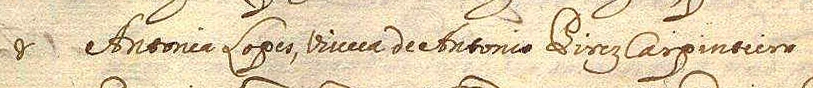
item Antonia Lopes, viuua de Antonio Pirez Carpinteiro
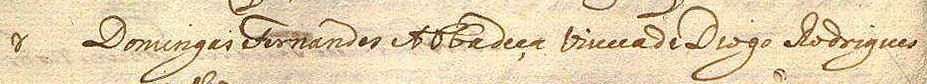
item Domingas Fernandes Abbadeça viuua de Diogo Rodrigues
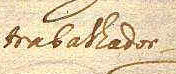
trabalhador
